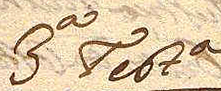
3a Testa
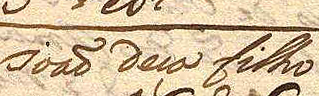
Ioaõ deça filho
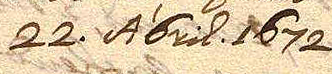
22. Abril. 1672
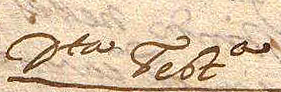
Dta Testa
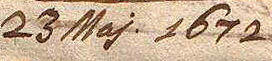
23 Maj. 1672
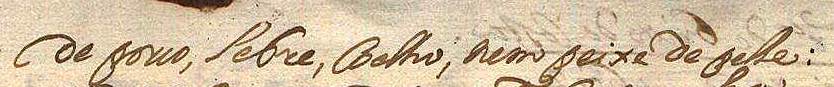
de porco, lebre, coelho, nem peixe de pelle:
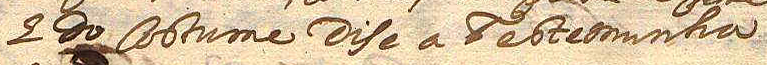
E do Costume dise a Testemunha
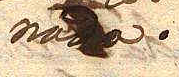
nada.
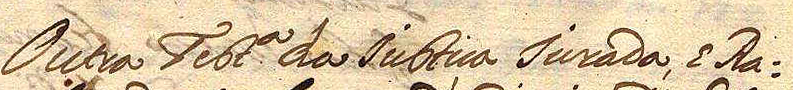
Outra Testa da Iustiça Iurada, E Ra
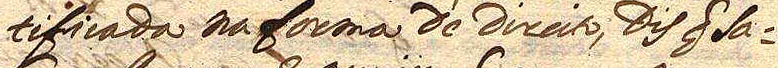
tificada na forma de direito, Dis q̄ sa
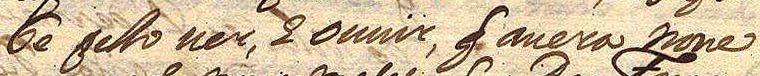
be pello uer, E ouuir, q̄ auera noue
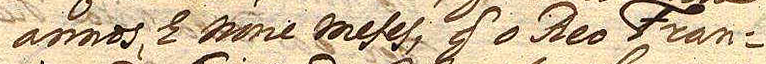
annos, E noue meses, q̄ o Reo Fran
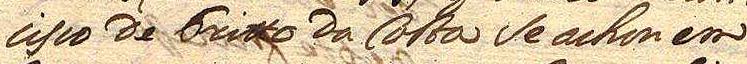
cisco de britto da Costa se achou em
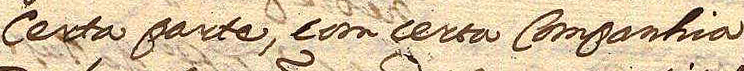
certa parte, com certa Companhia
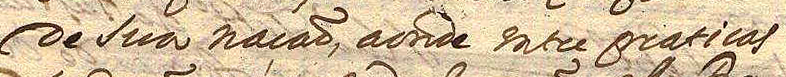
de sua naçaõ, aonde entre praticas
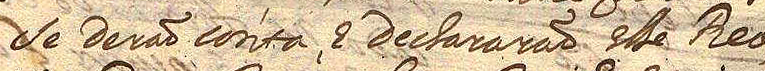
se deraõ conta, E declararão Elle Reo
